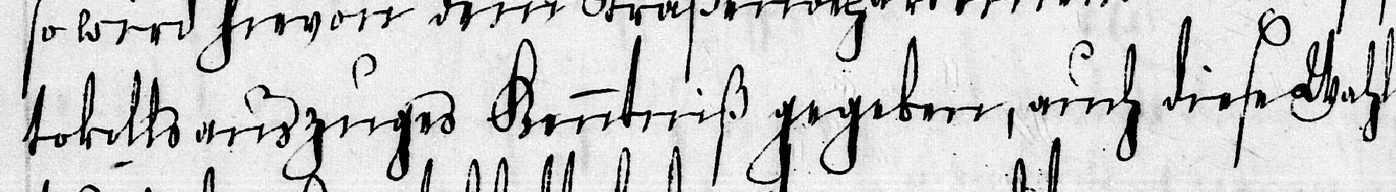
otokollsauszuges Kenntniß gegeben, auch diese Wahl
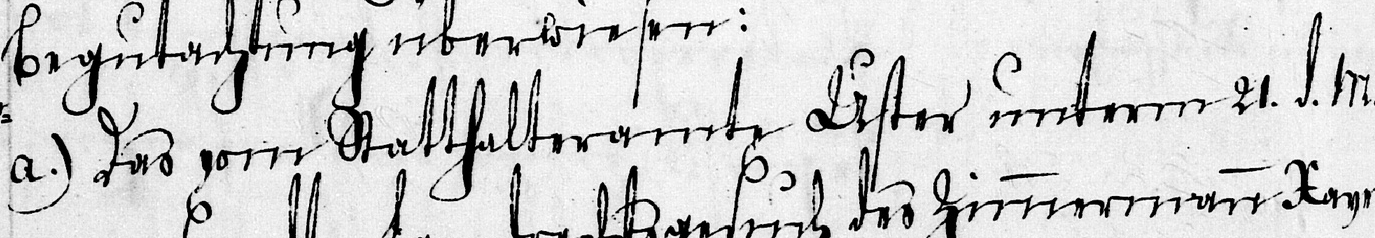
b.) Das vom Statthalteramt Zürich unterm 25. d.
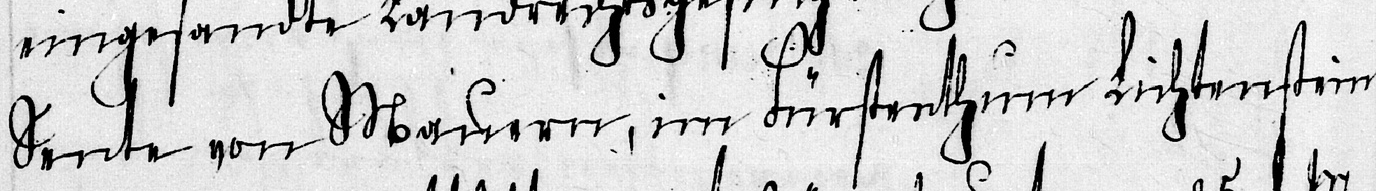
Sente von Mauern, im Fürstenthum Lichtenstein.
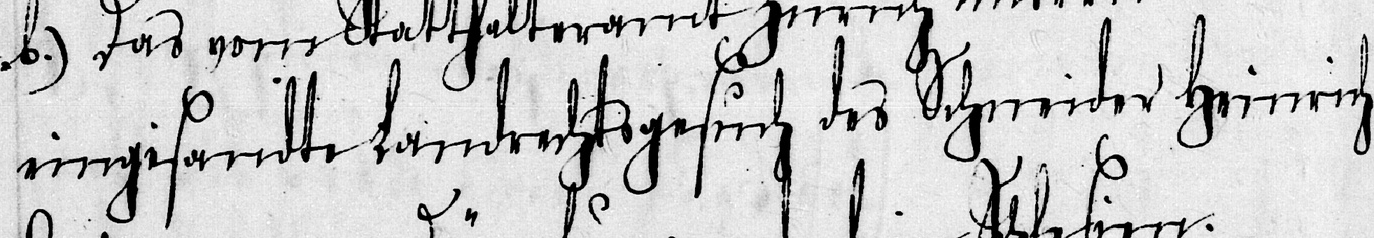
eingesandte Landrechtsgesuch des Schneider Heinrich
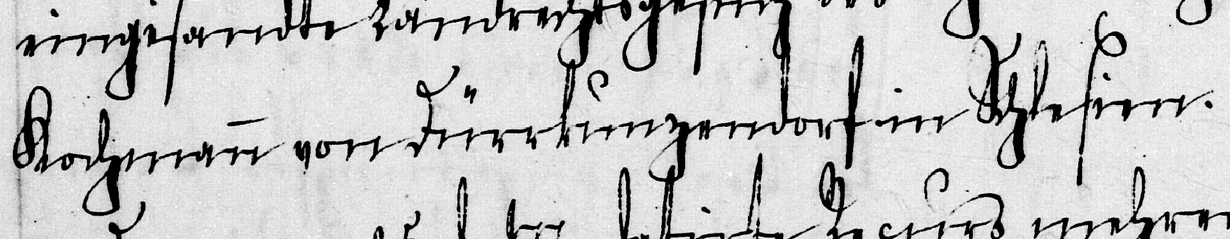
Kochmann von Dürrkunzendorf in Schlesien.
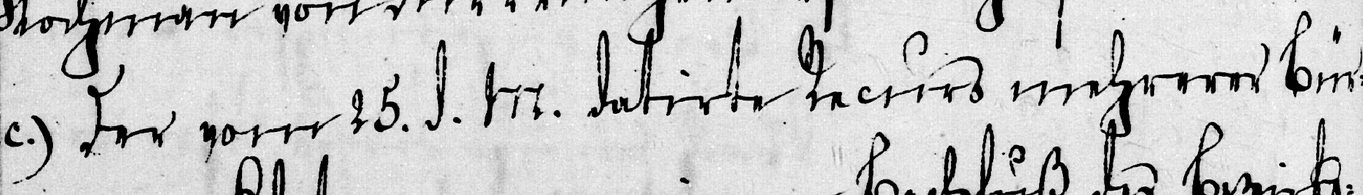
c.) Der vom 25. d. M. datirte Recurs mehrerer Bür¬
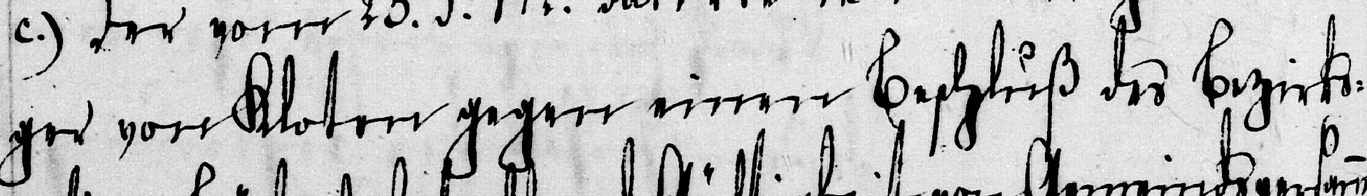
ger von Kloten gegen einen Beschluß des Bezirks¬
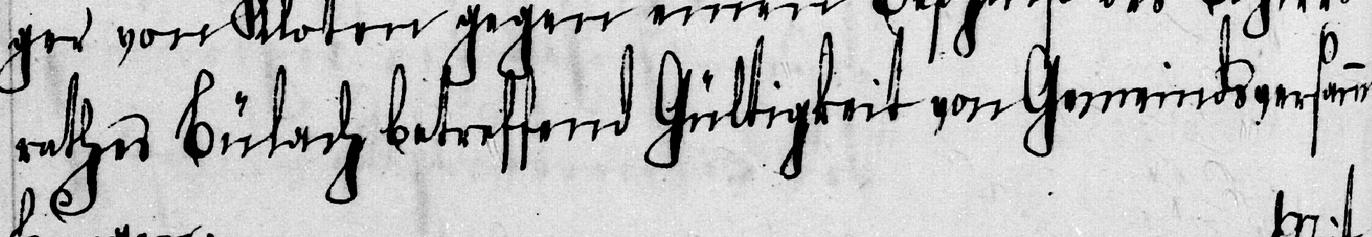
rathes Bülach betreffend Gültigkeit von Gemeindsver¬
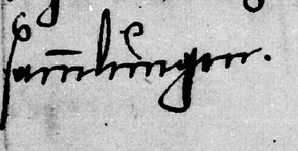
sammlungen.
